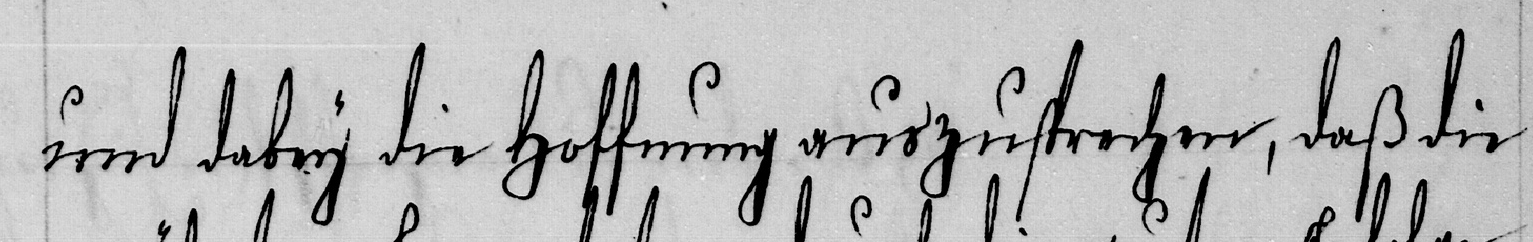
und dabey die Hoffnung auszusprechen, daß die
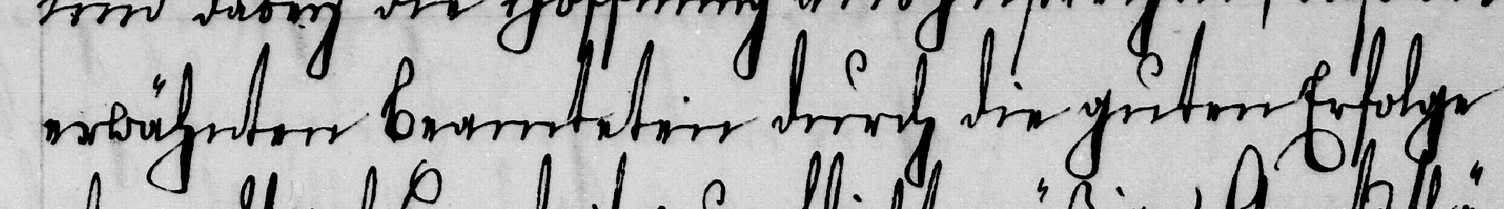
erwähnten Beamteten durch die guten Erfolge
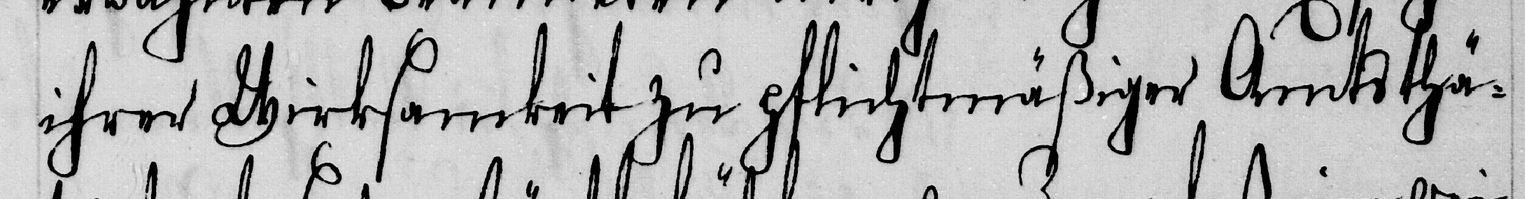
ihrer Wirksamkeit zu pflichtmäßiger Amtsthä¬
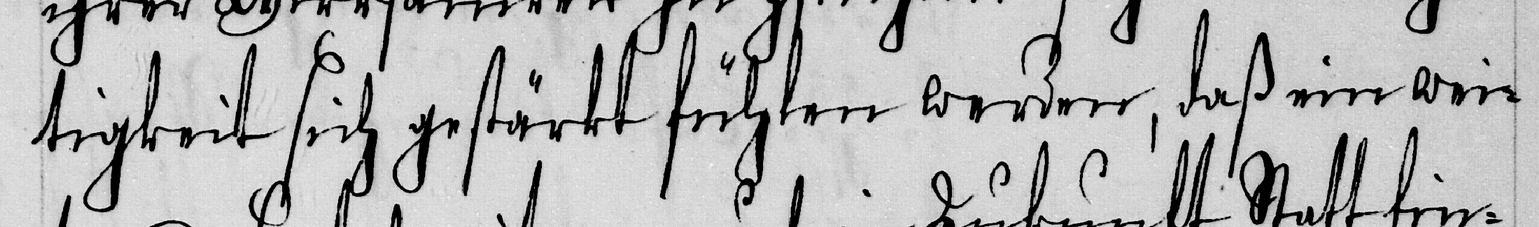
tigkeit sich gestärkt fühlen werden, daß ein wei¬
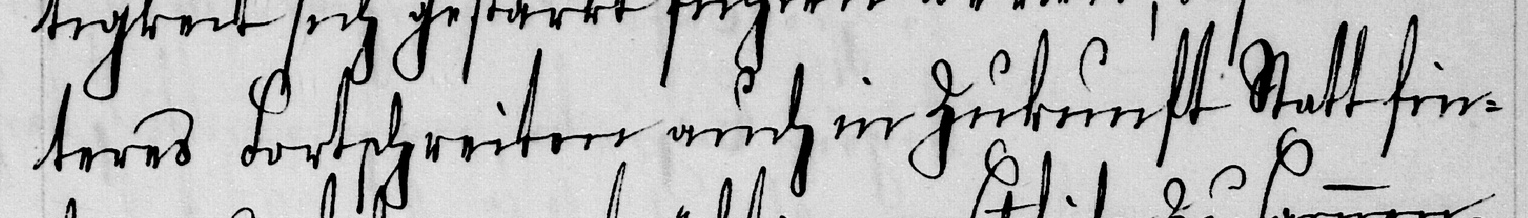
teres Fortschreiten auch in Zukunft Statt fin¬
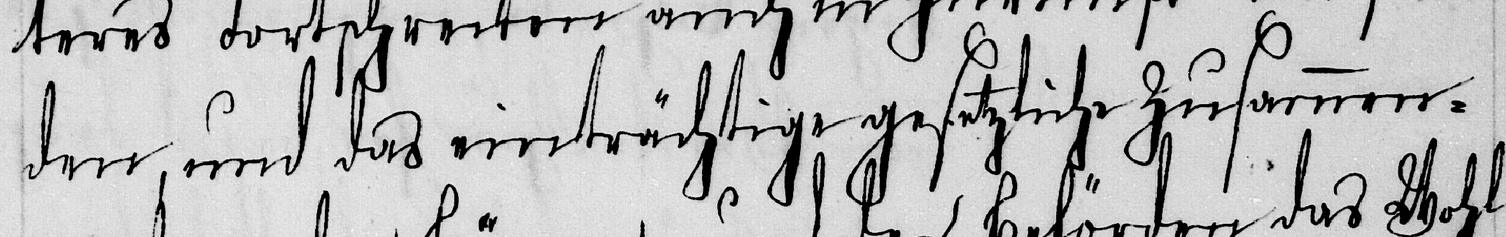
den, und das einträchtige gesetzliche Zusammen¬
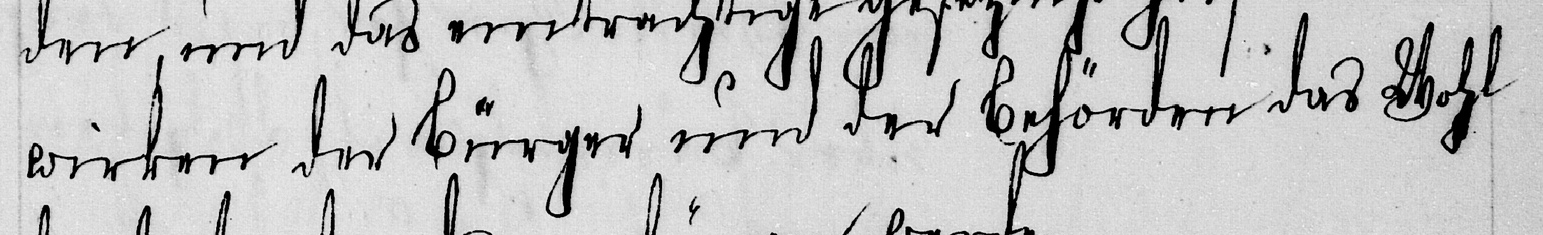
wirken der Bürger und der Behörden das Wohl
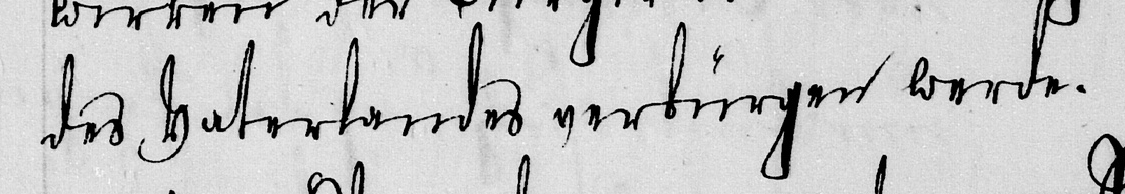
des Vaterlandes verbürgen werde.
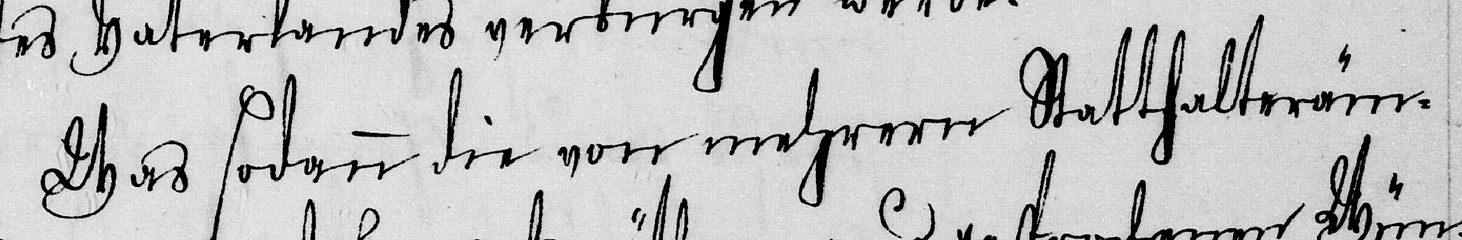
Was sodann die von mehrern Statthalteräm¬
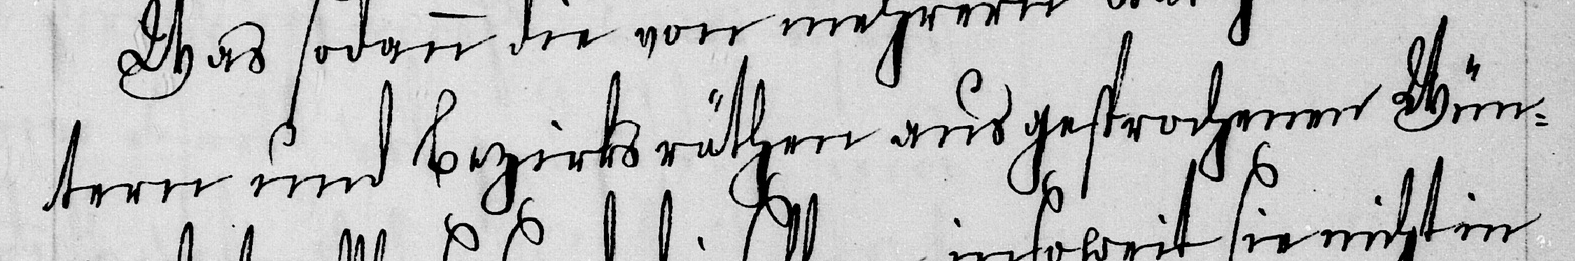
tern und Bezirksräthen ausgesprochenen Wün¬
